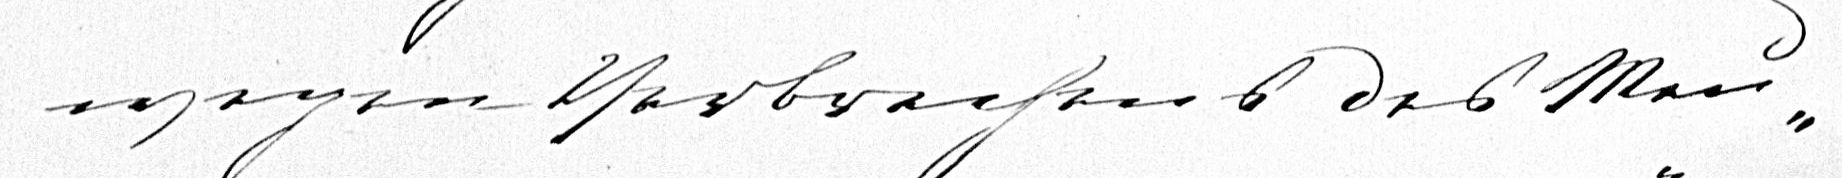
wegen Verbrechens des Meu¬
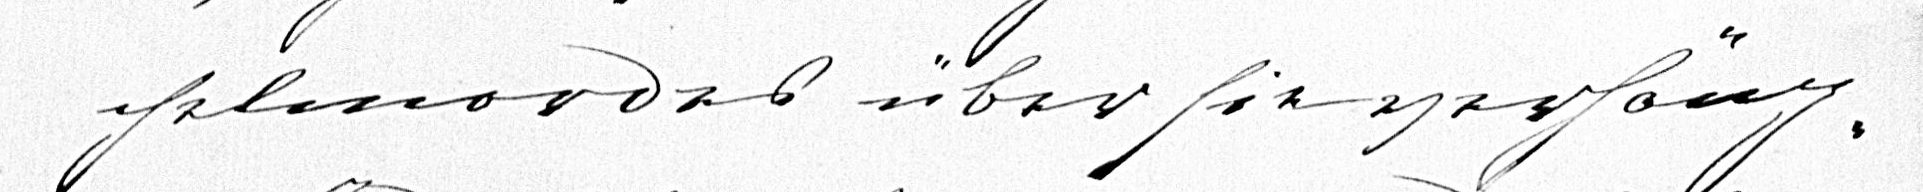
chelmordes über sie verhäng¬
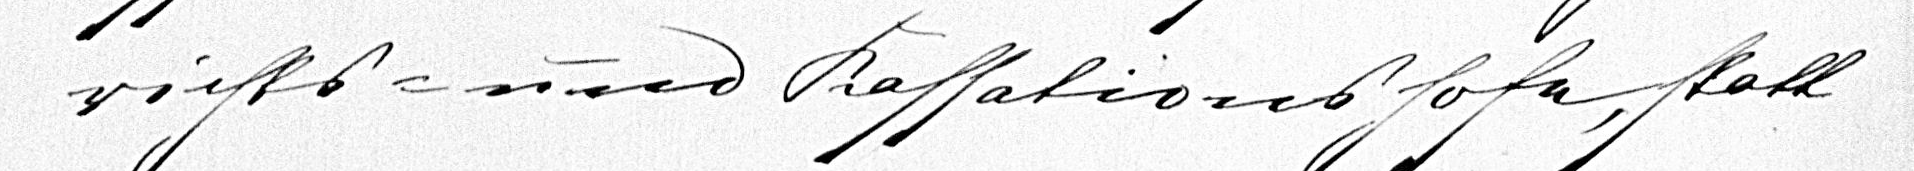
richts- und Kassationshofe, statt
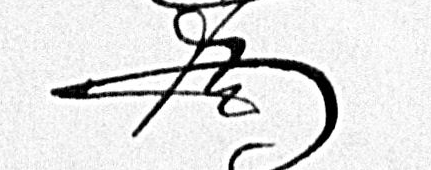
xx
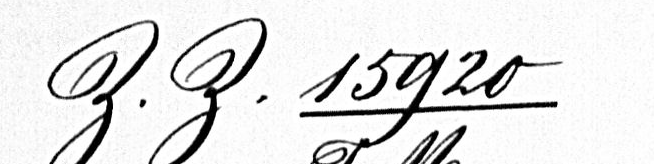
Z.Z. 15920/
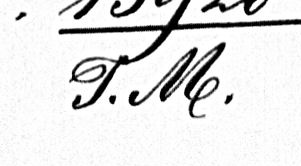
J.M.
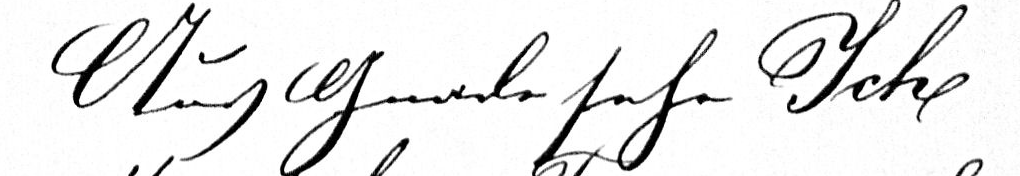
Aus Gnade sehe Ich
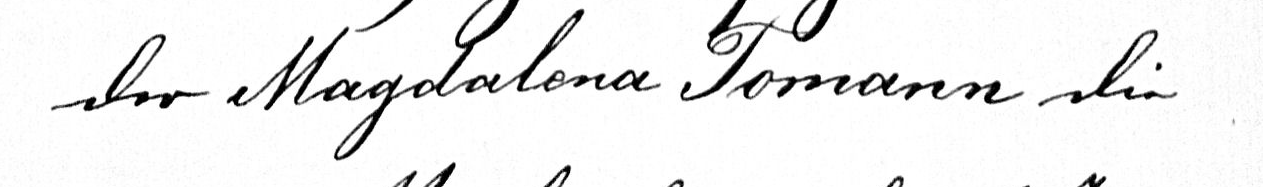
der Magdalena Tomann die
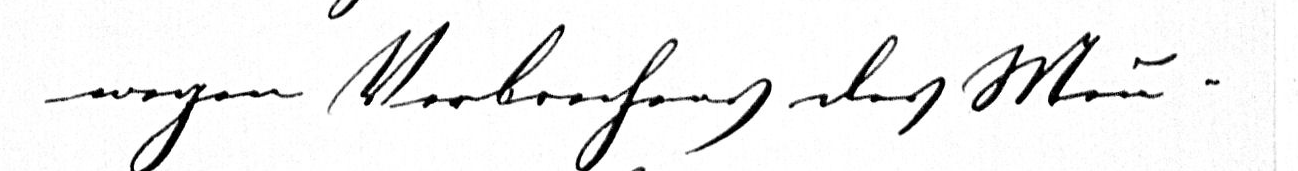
wegen Verbrechens des Meu¬
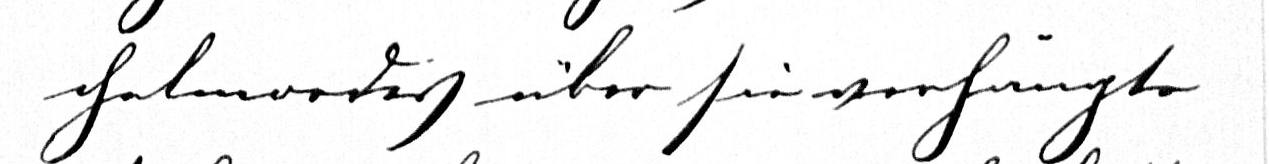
chelmordes über sie verhängte
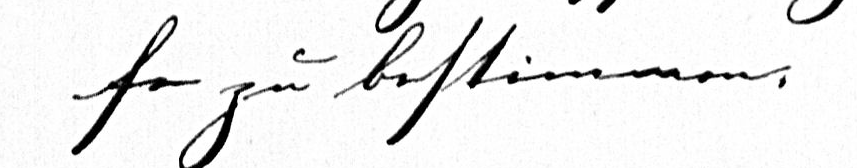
fe zu bestimmen.
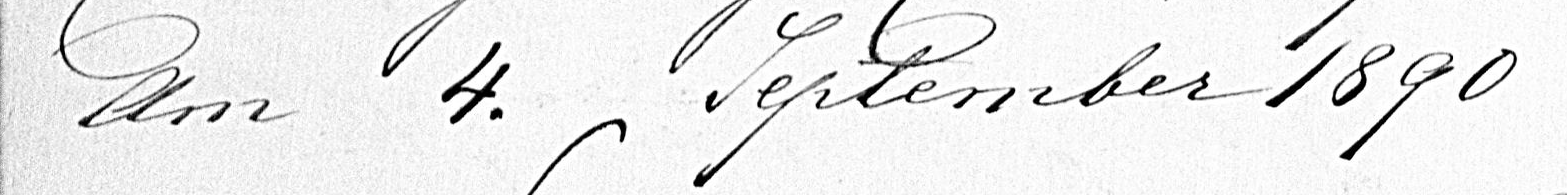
Am 4. September 1890
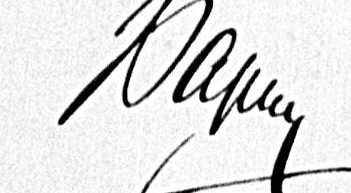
xx
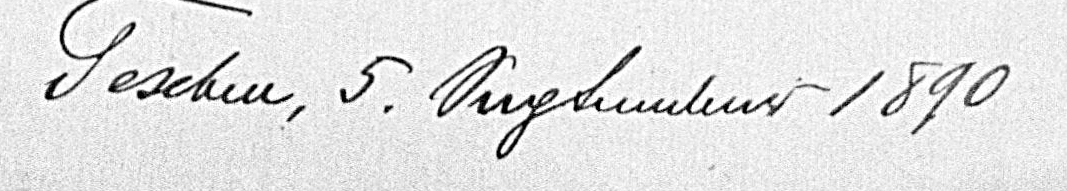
Teschen, 5. September 1890
